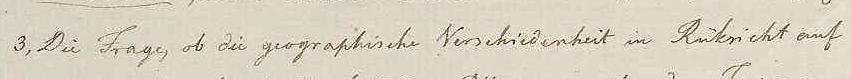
3, Die Frage, ob die geographische Verschiedenheit in Rüksicht auf
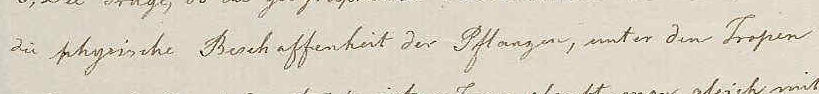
die physische Beschaffenheit der Pflanzen, unter den Tropen
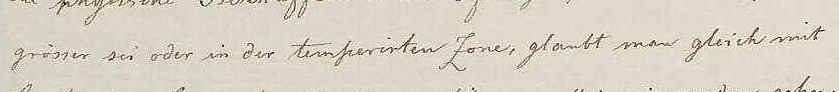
grösser sei oder in der temperirten Zone, glaubt man gleich mit
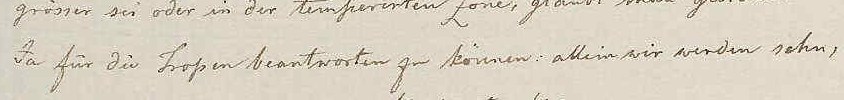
Ja für die Tropen beantworten zu können: allein wir werden sehn,
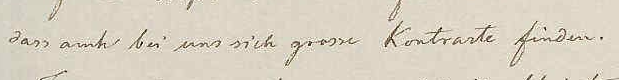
dass auch bei uns sich grosse Kontraste finden.
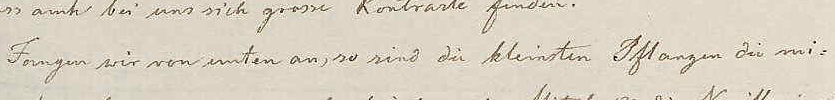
Fangen wir von unten an, so sind die kleinsten Pflanzen die mi-
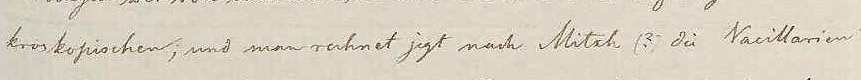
kroskopischen, und man rechnet jezt nach Mitsch die Vacillarien
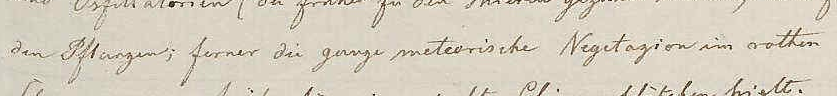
den Pflanzen; ferner die ganze meteorische Vegetazion im rothen
